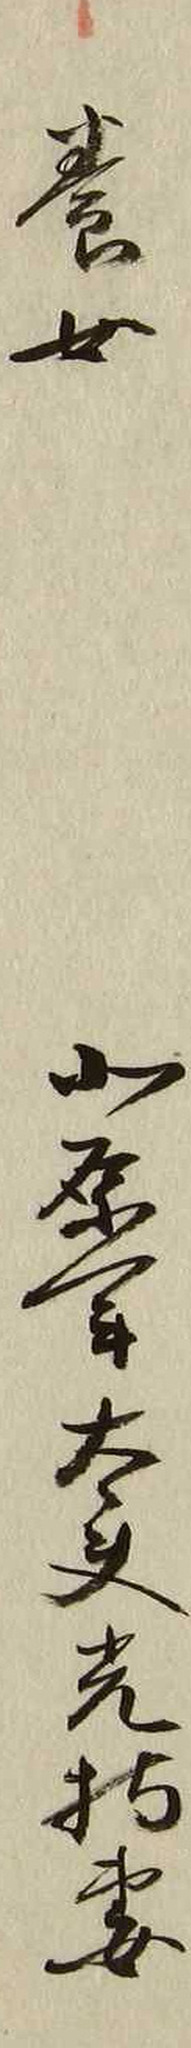養女北原軍太夫光持妻
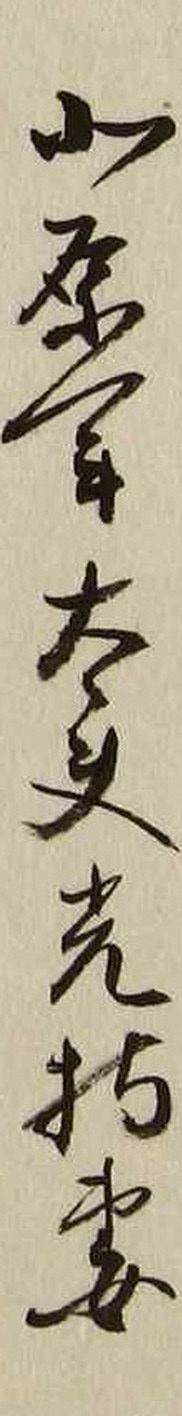養女北原軍太夫光持妻
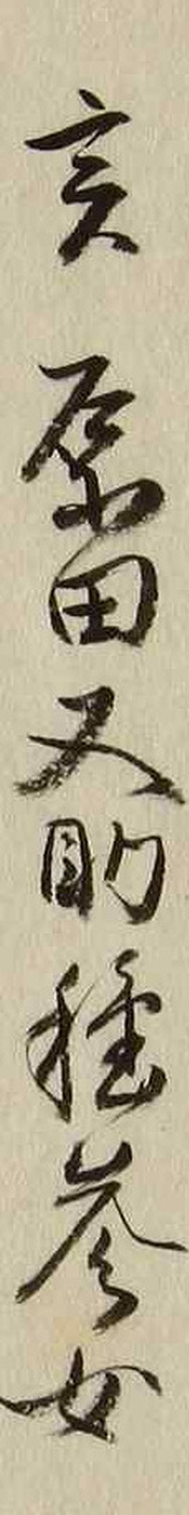実原田又助種参女
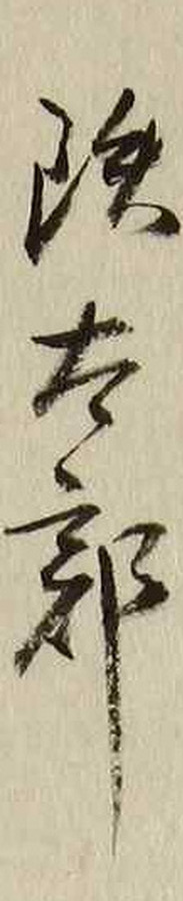鉄太郎
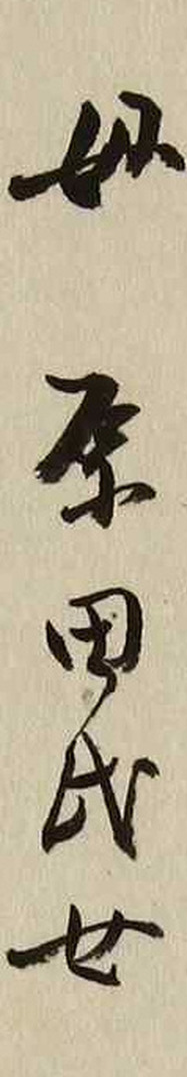母原田氏女
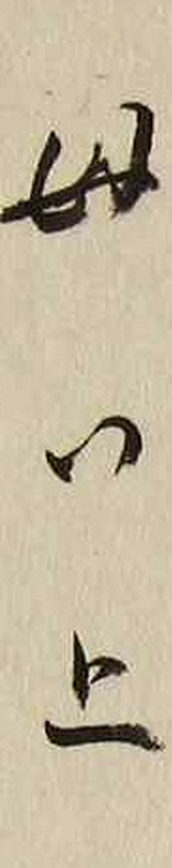母同上
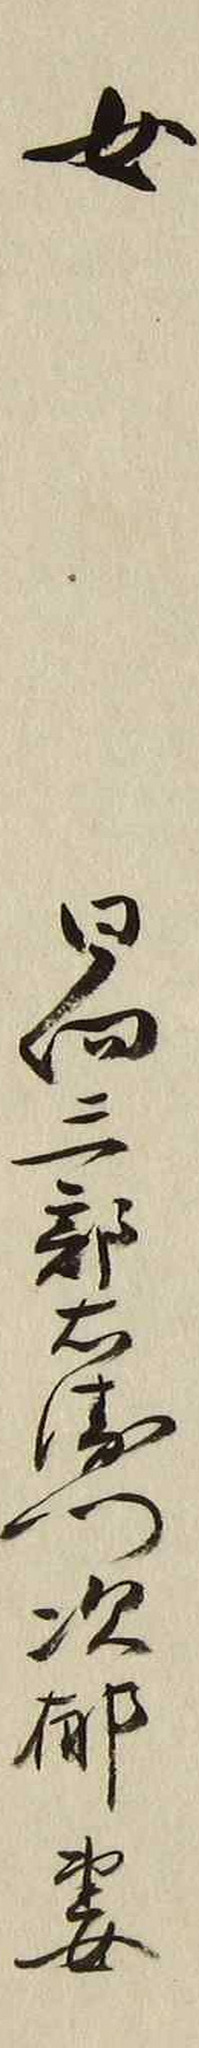女日向三郎右衛門次郎妻
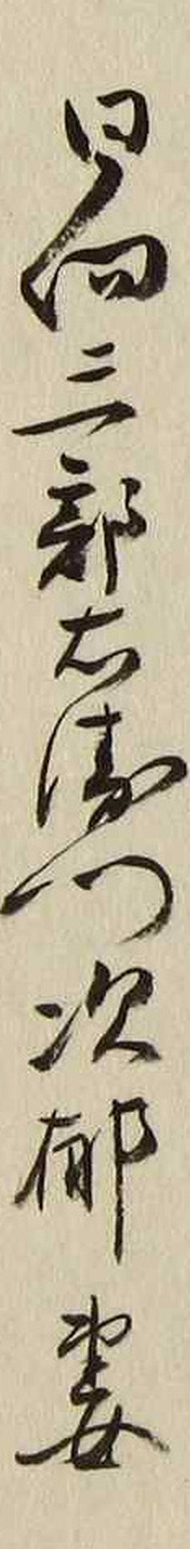女日向三郎右衛門次郎妻

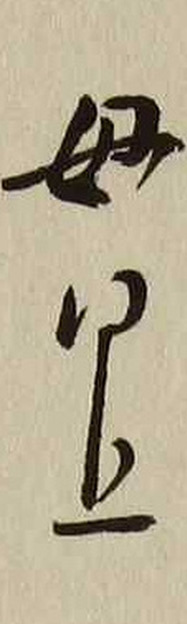母同上
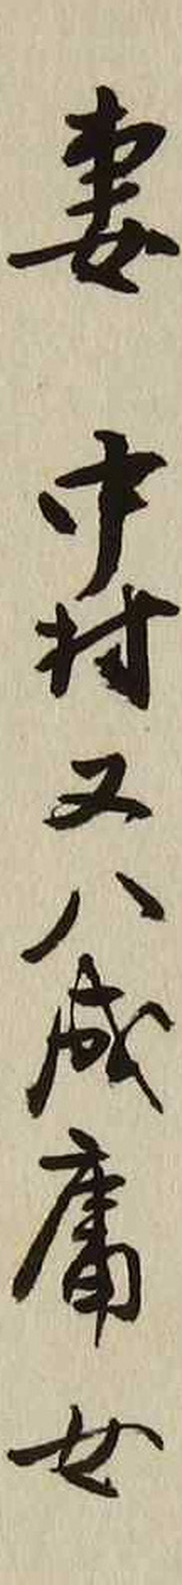妻中村又八成庸女
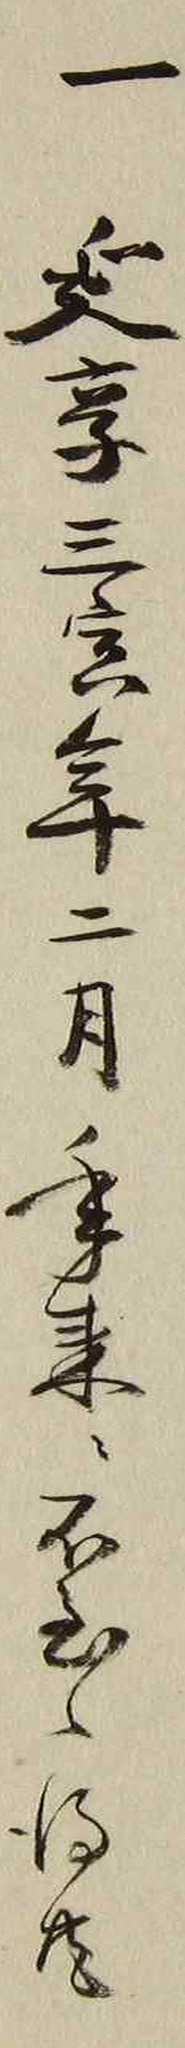一延享三寅年二月年來に不至候得共
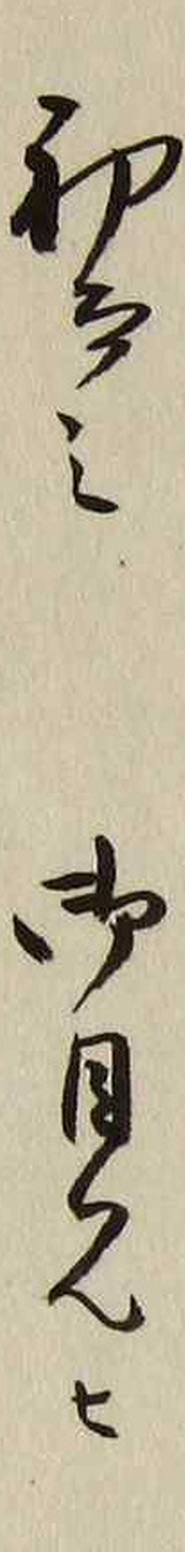初而之御目見被
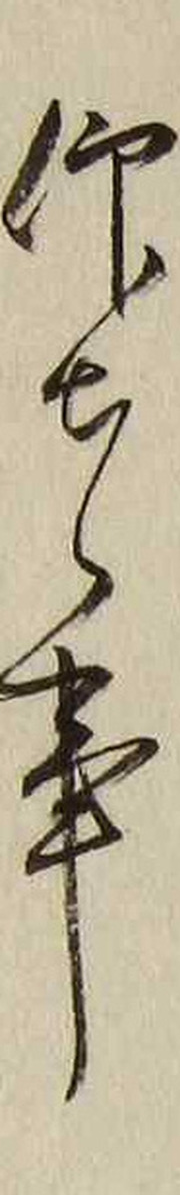仰出候事
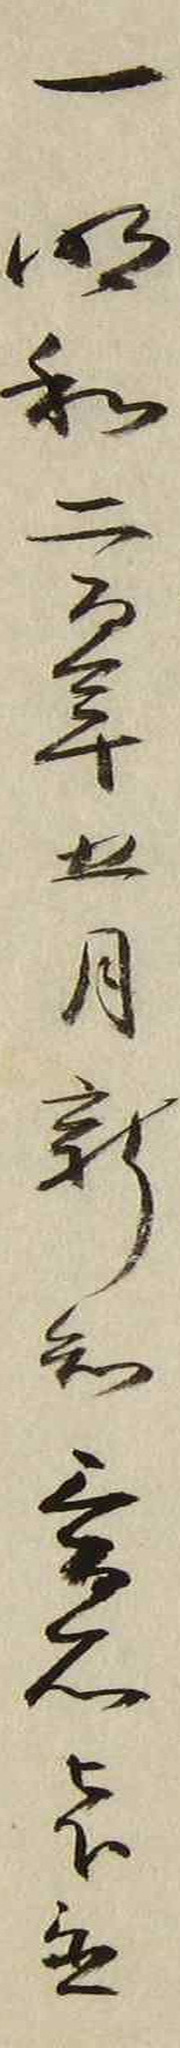一明和二酉年五月新知三百石被下置
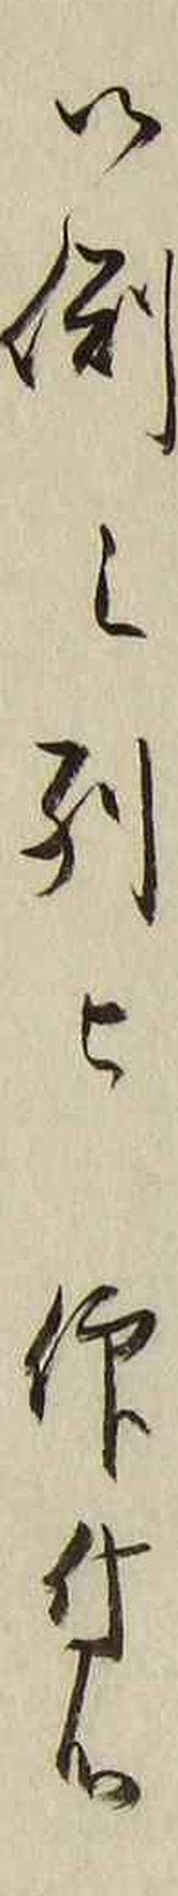御側之列被仰付候

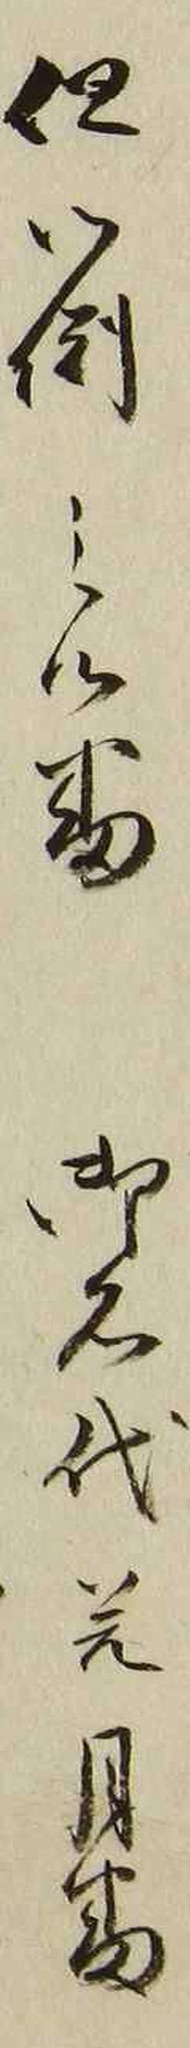但御側之御番御名代并月番
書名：諸士系譜　巻之292　き之部1
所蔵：会津若松市立会津図書館
